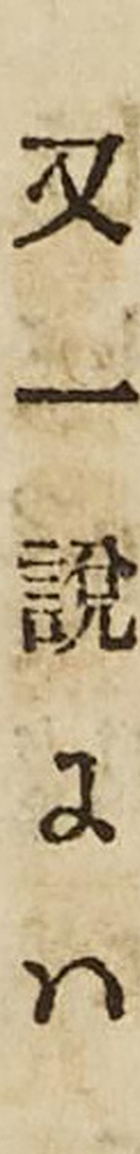又一説には
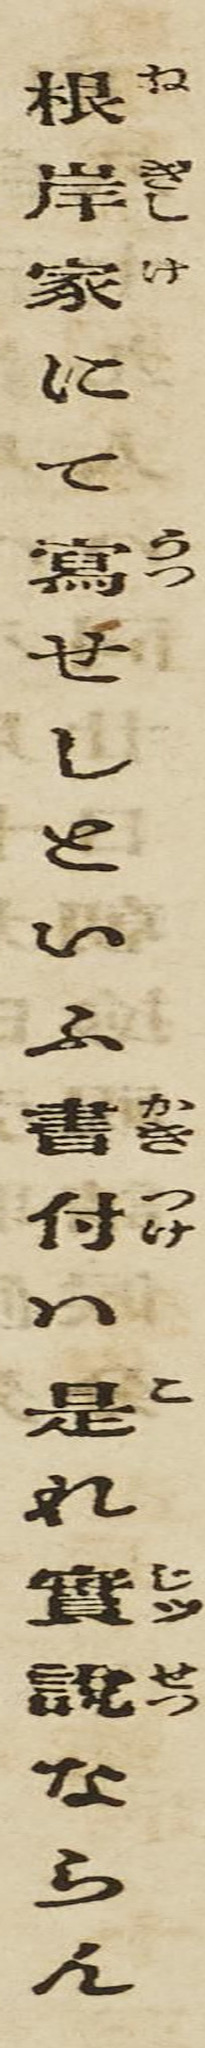根岸家にて写せしといふ書付は是れ実説ならん
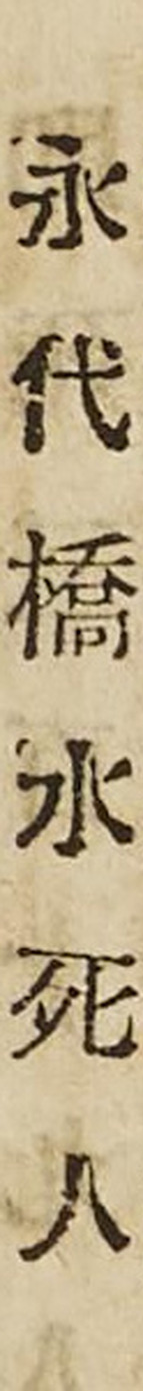永代橋水死人
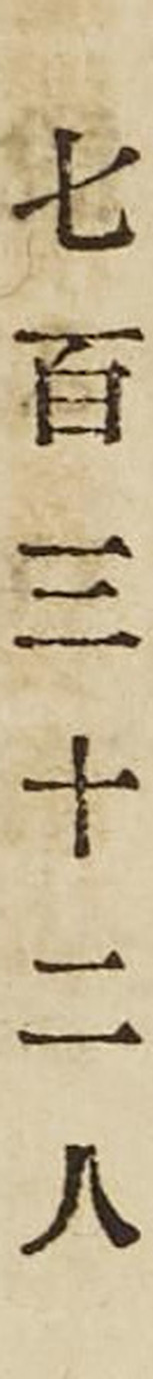七百三十二人
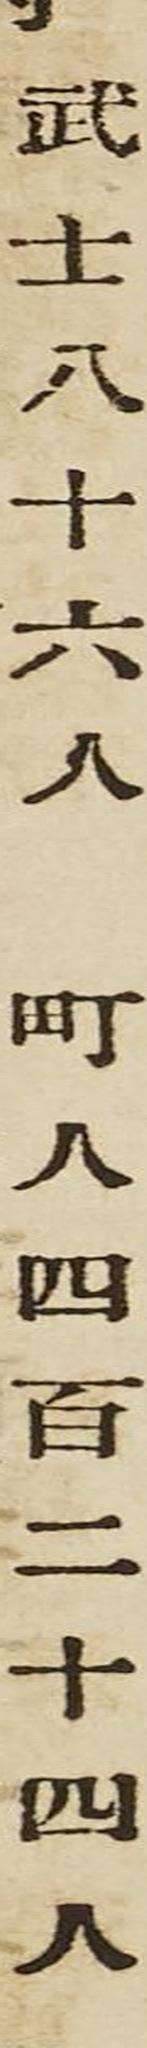内武士八十六人町人四百二十四人
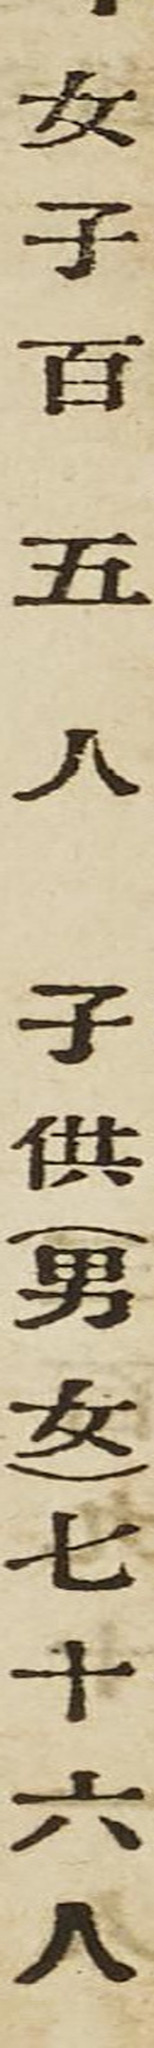女子百五人子供|七十六人
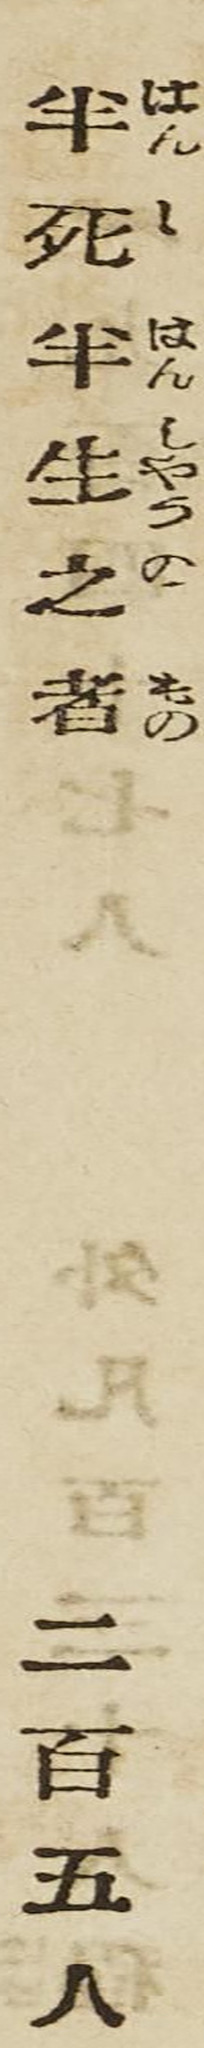半死半生之者二百五人
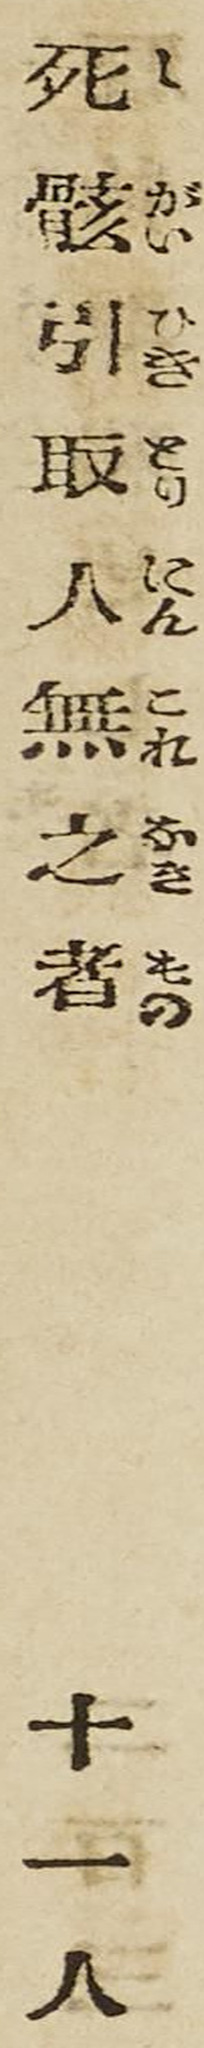死骸引取人無之者十一人

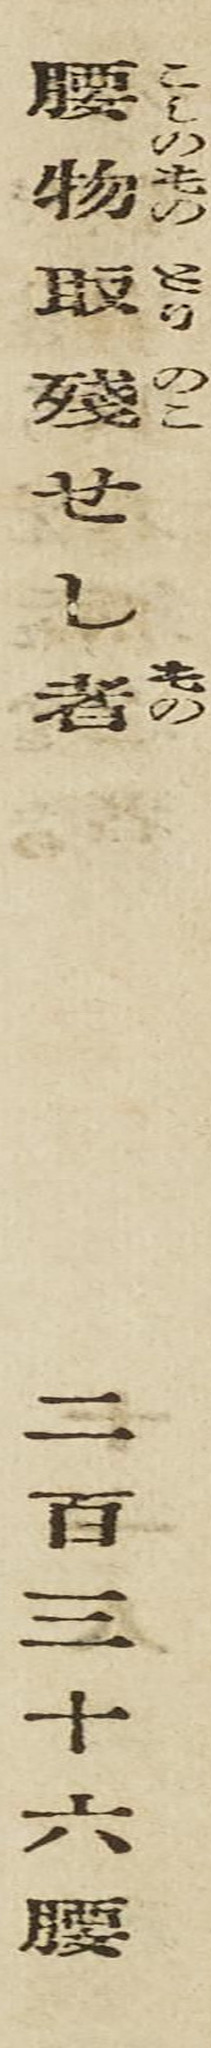腰物取残せし者二百三十六腰
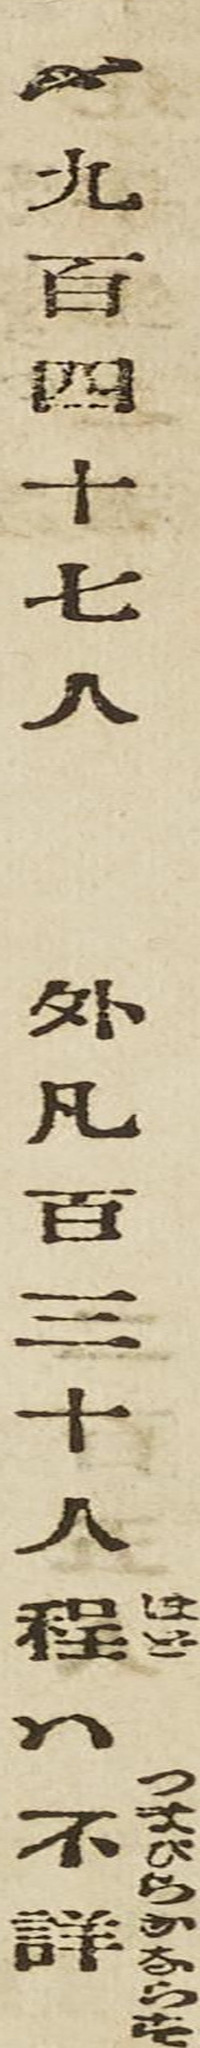〆九百四十七人外凡百三十人程は不詳
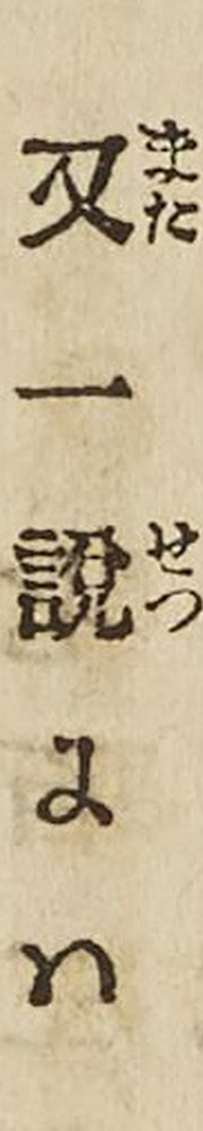又一説には
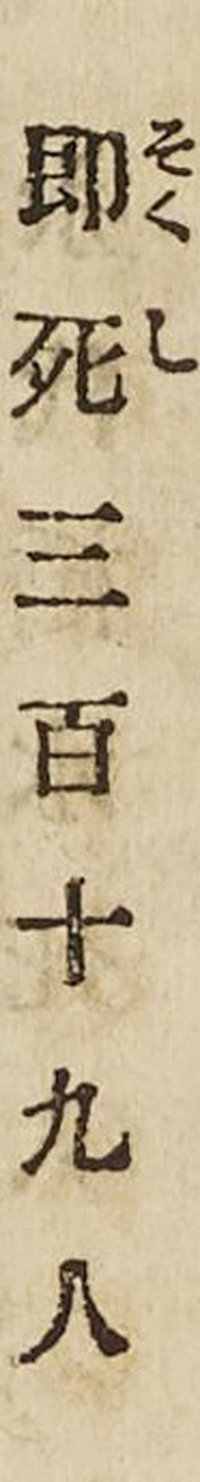即死三百十九人
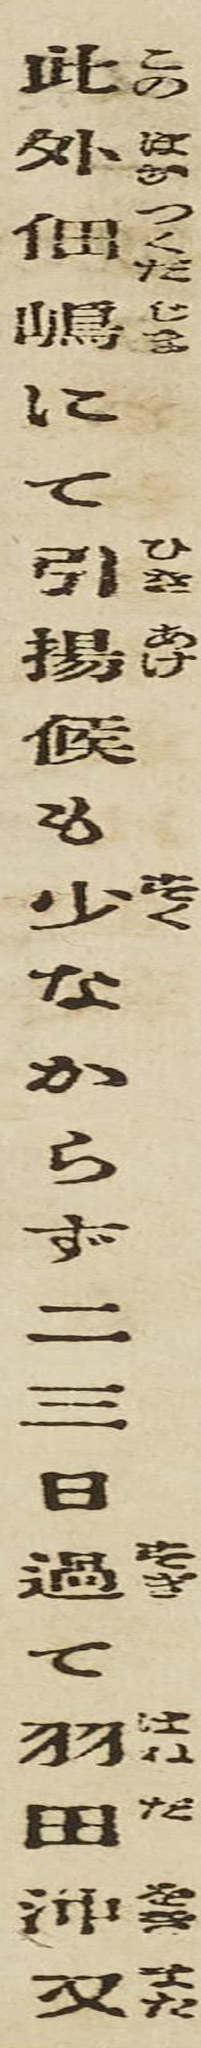此外佃島にて引揚候も少なからずニ三日過て羽田沖又
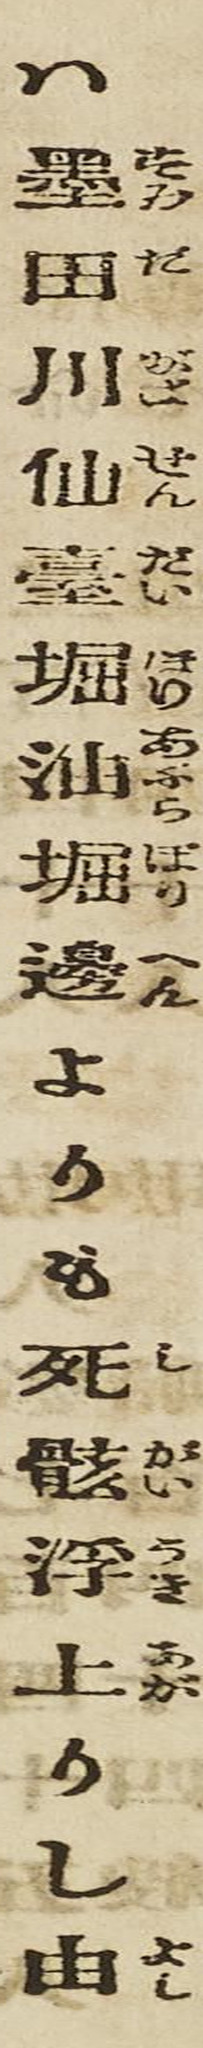は隅田川仙台堀油堀辺よりも死骸浮上りし由
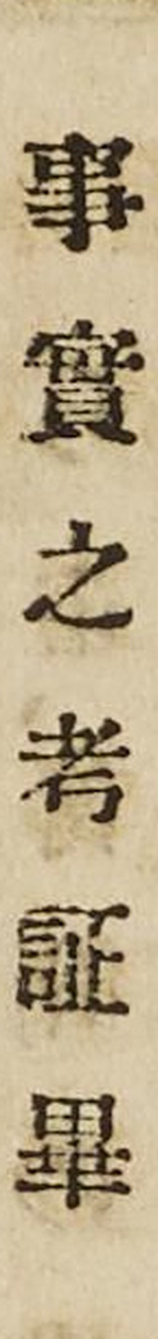事実之考証畢
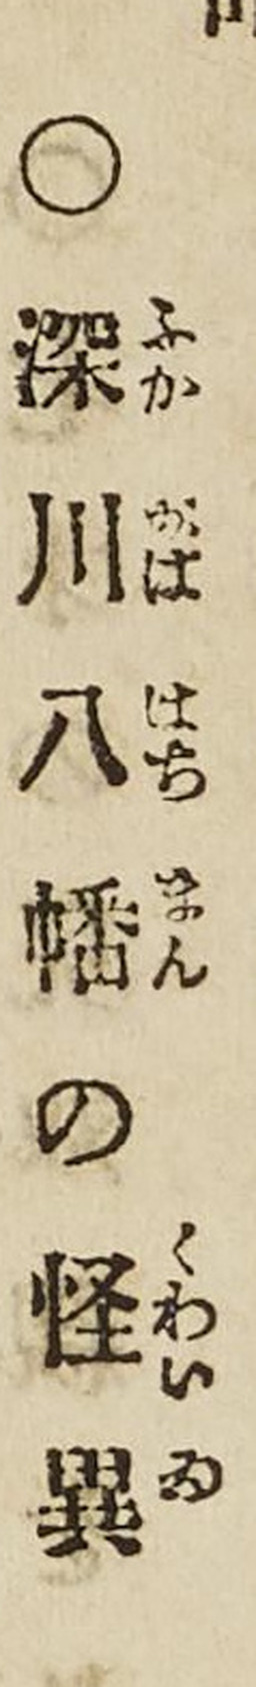○深川八幡の怪異
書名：永代惨話　文化の夢　全
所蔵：東京大学地震研究所図書室 Earthquake Research Institute Library, The University of Tokyo, JAPAN
